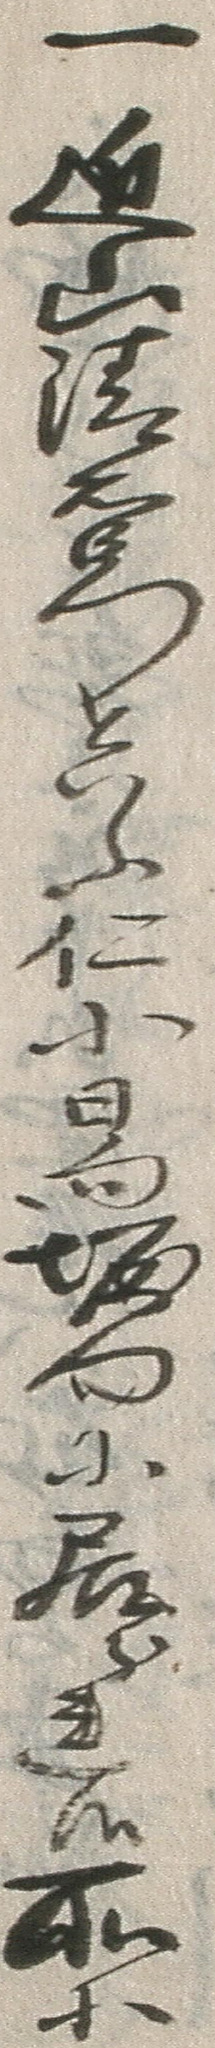一近山清右衛門といふ仁小日向堀向に居られ候所に
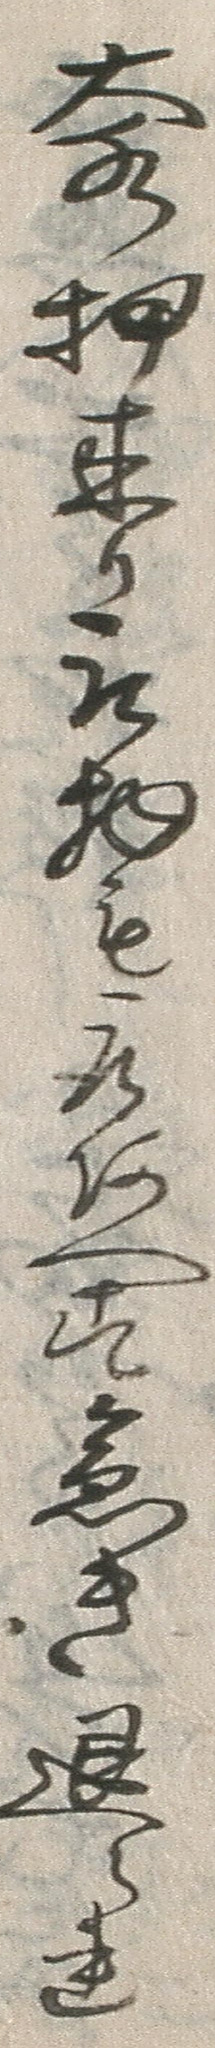大水押来り取物も取あへす急き退られ
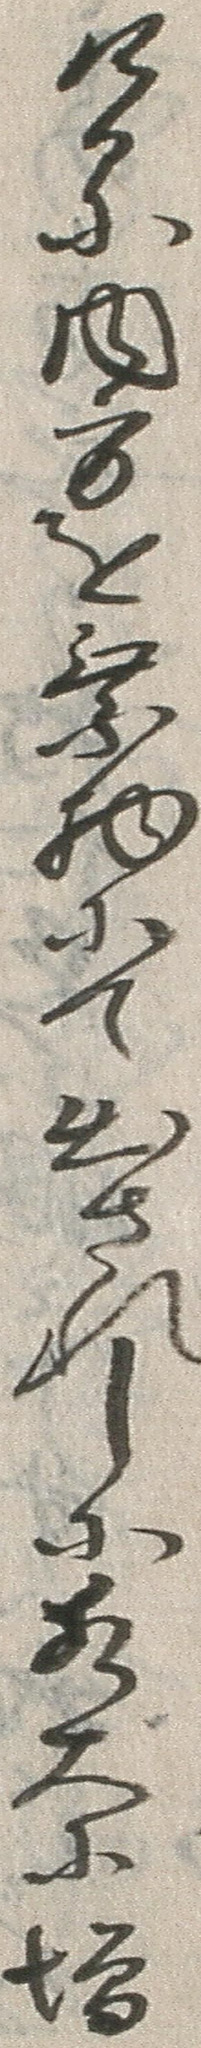けるに内方を乗物にて出されしに水大に増
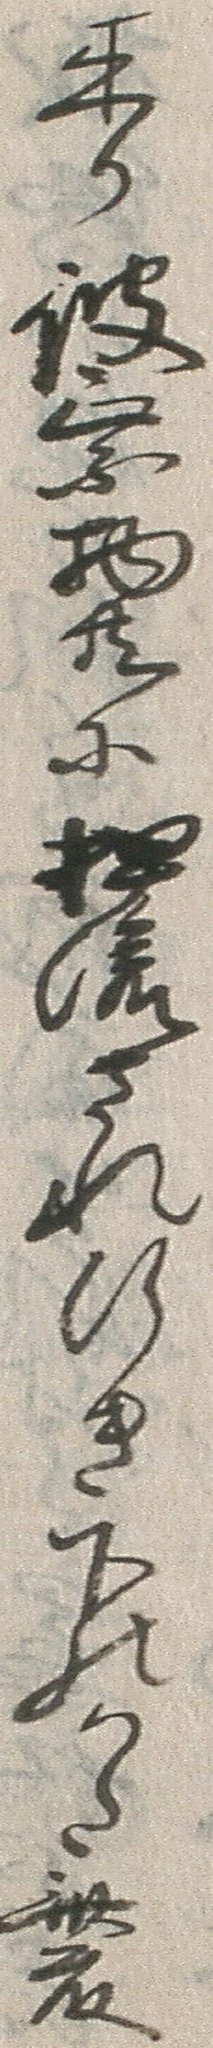来り彼乗物共に押流され行き下のかた斎藤
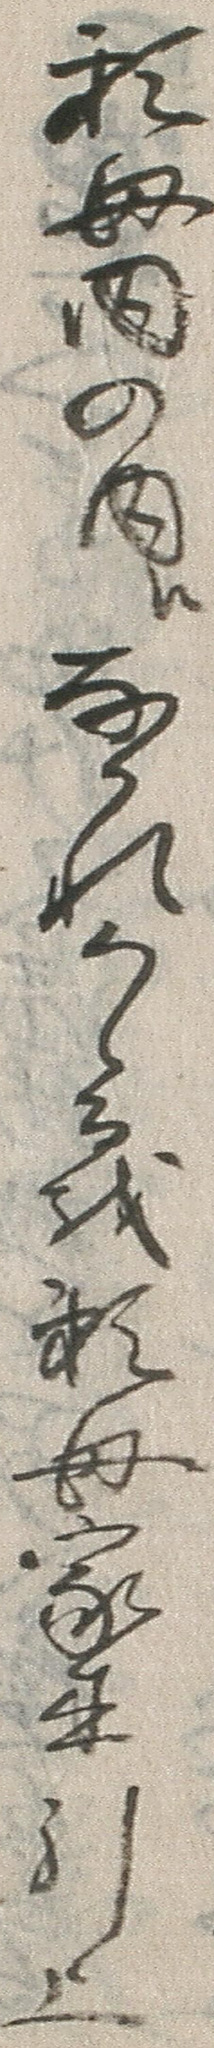頼母内の内江なかれかゝるを頼母家来引上
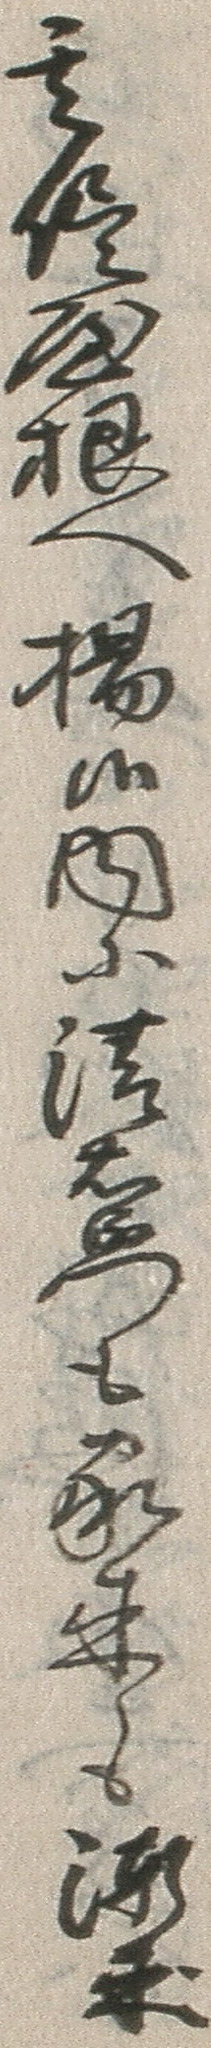其儘屋根へ揚候内に清右衛門も家来も漸来
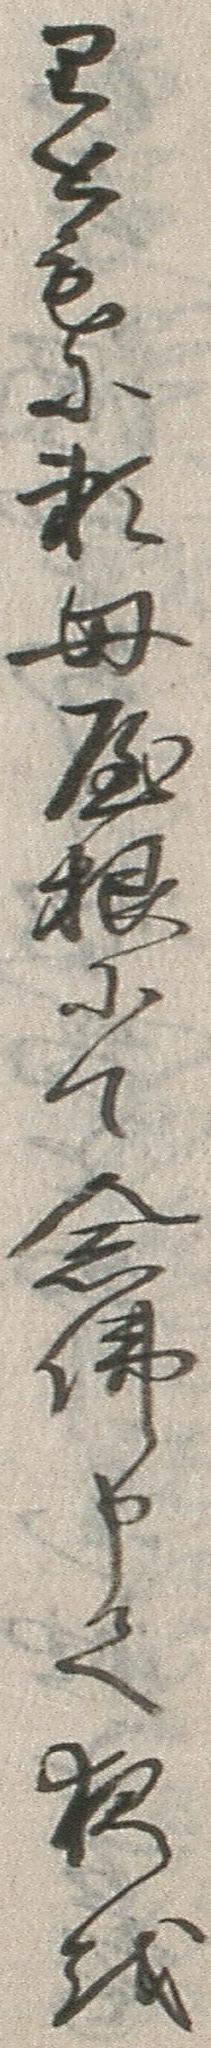りともに頼母屋根にて念仏申て夜を
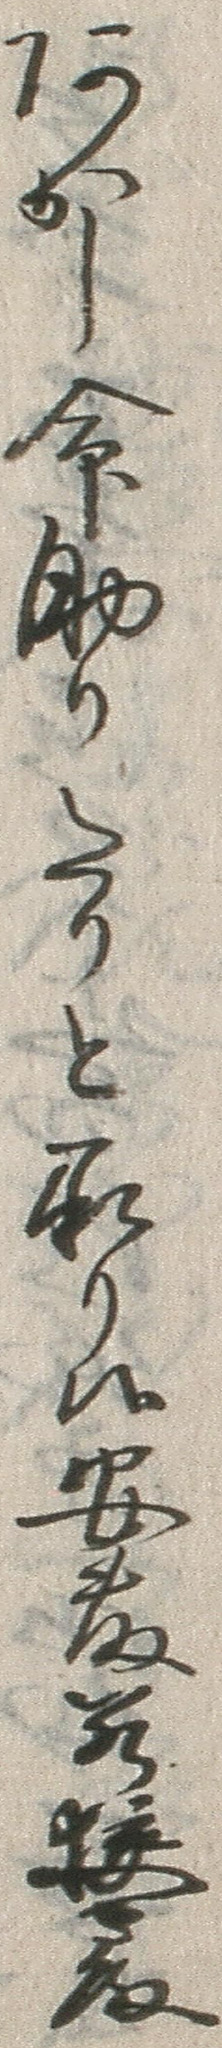あかし命助りたりと承り候安藤若狭守殿
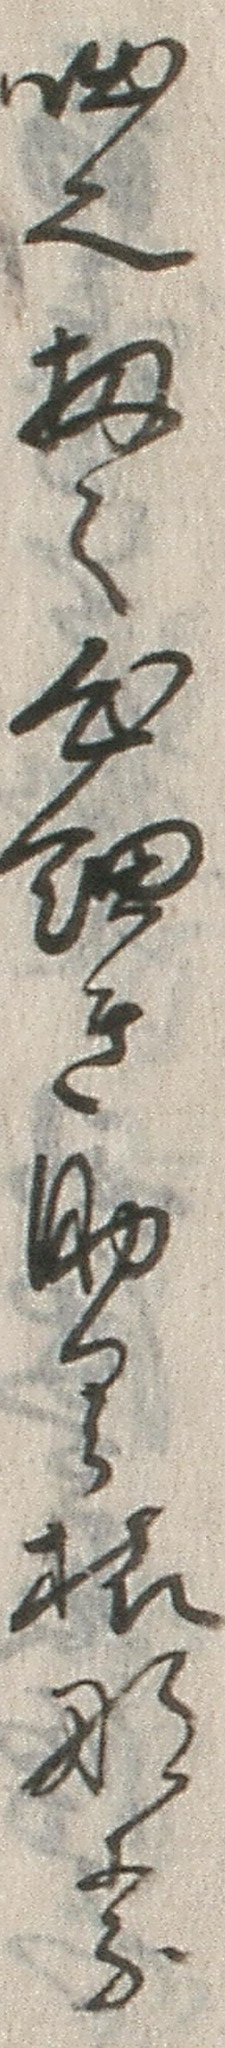咄也扨々心細き助り様なり
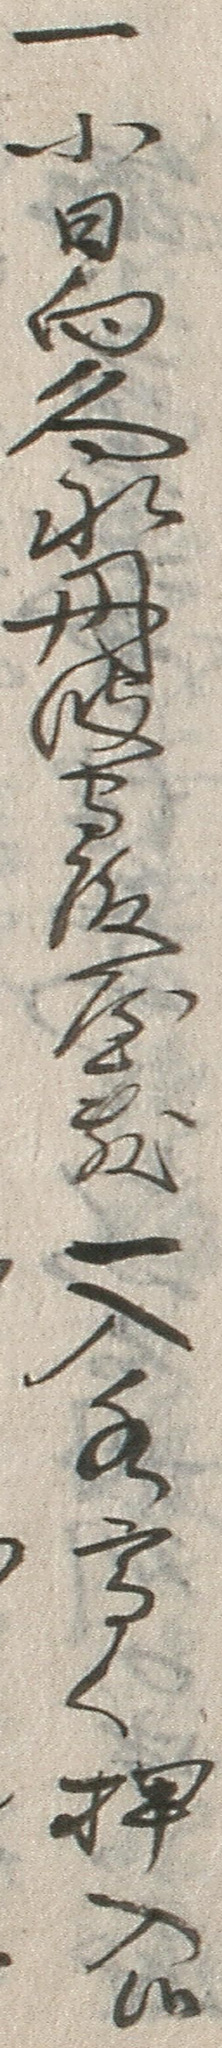一小日向久永丹波守殿屋敷一入水高く押入候
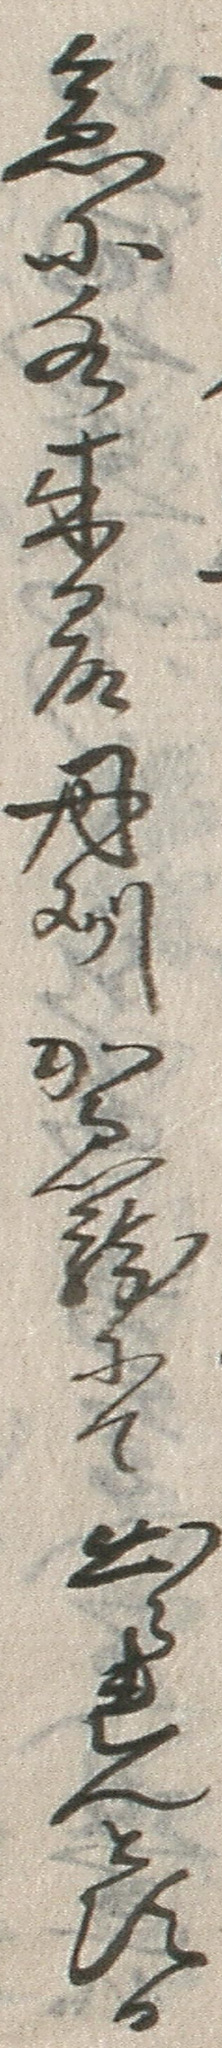急に水来る故丹州駕籠にて出られんと頃か
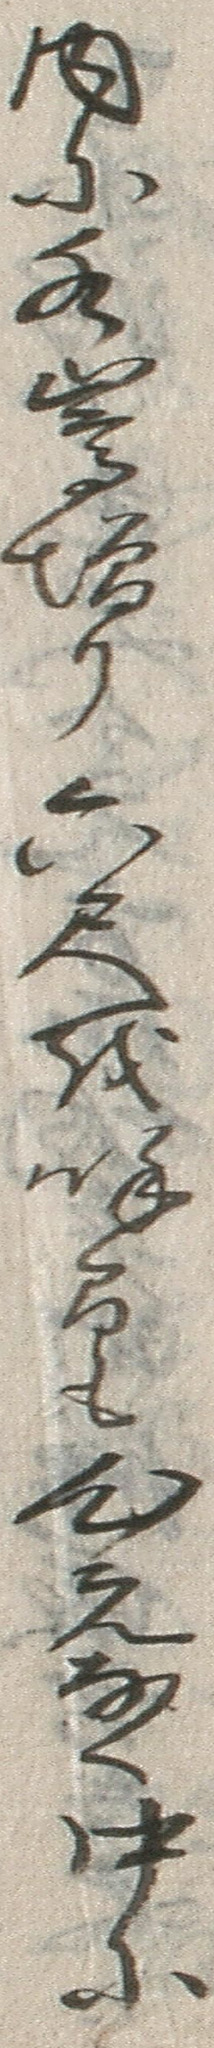内に水嵩増り六尺を呼間も心元なく中小
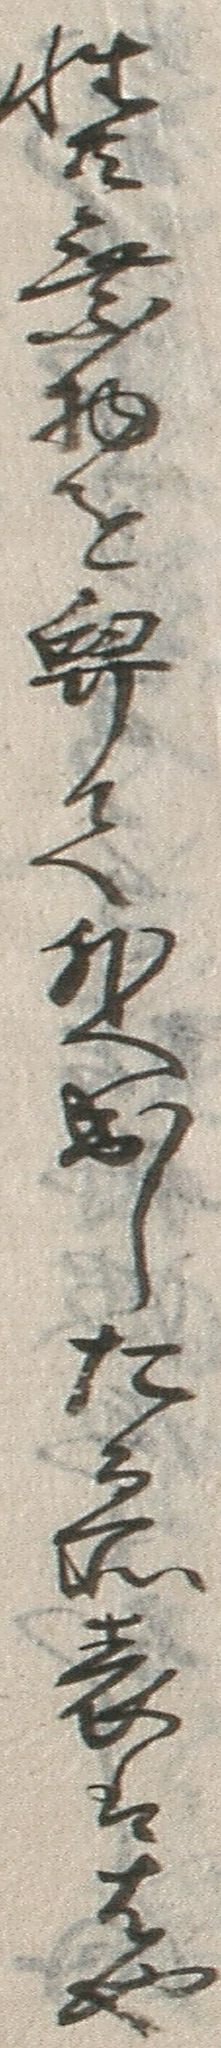性共乗物を舁て外へ出したる所表ははや
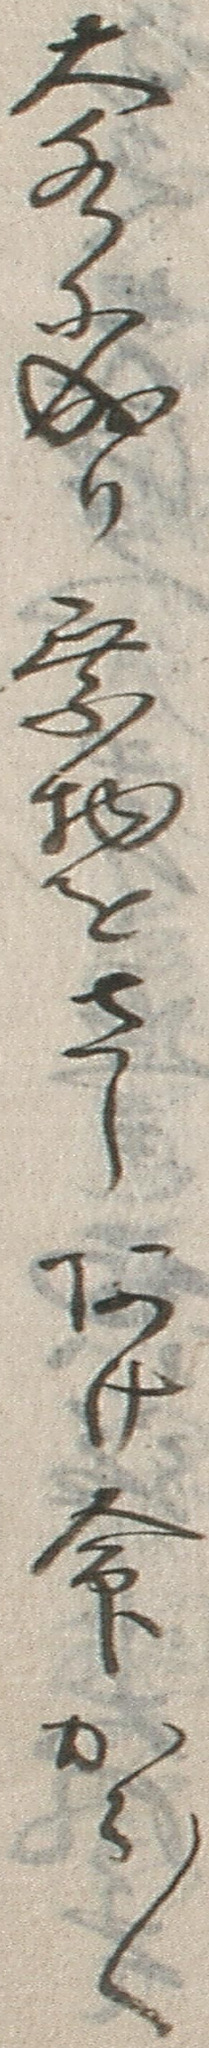大水に成り乗物をさしあけ命から〳〵

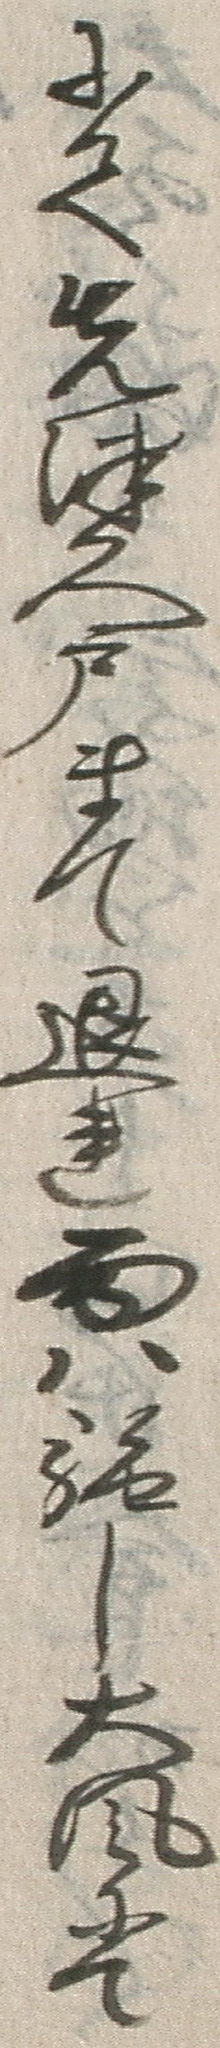にて先津久戸まて退き雨は強し大風にて
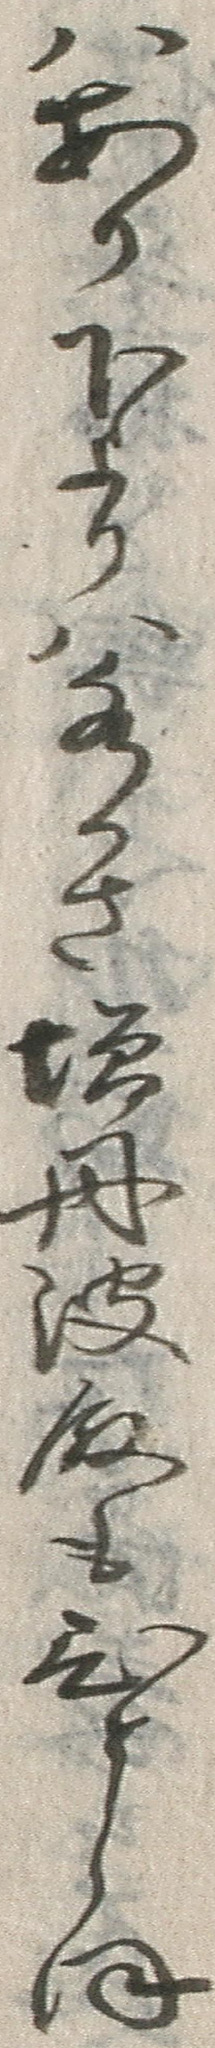はあり下よりは水かさ増丹波殿もひとしほ
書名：享保十三年江戸洪水記
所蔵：東京大学地震研究所図書室 Earthquake Research Institute Library, The University of Tokyo, JAPAN
